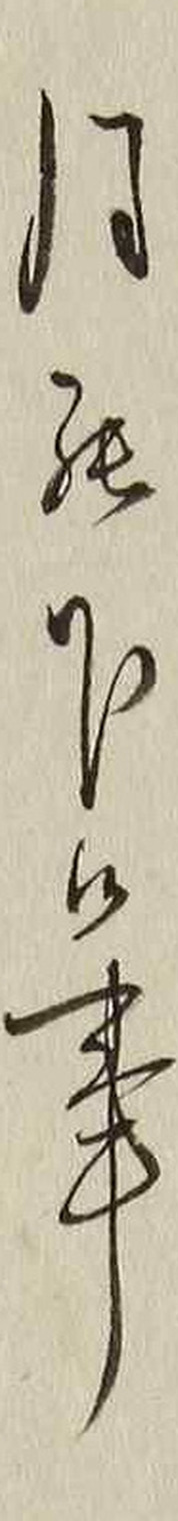月罷下候事
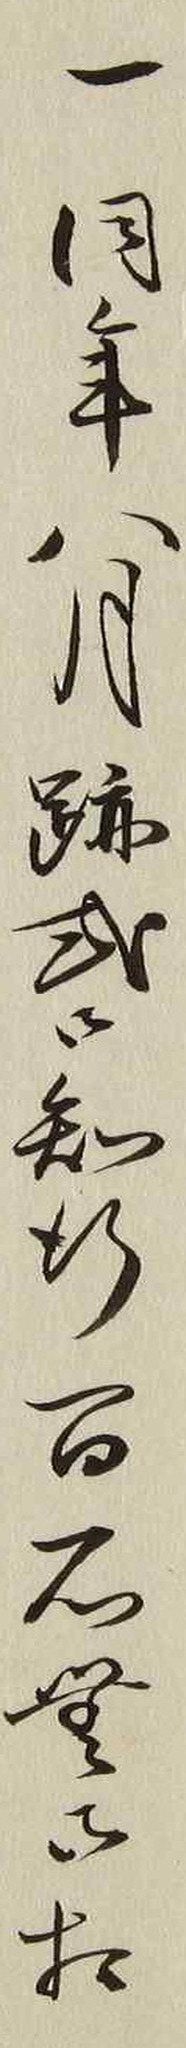一同年八月跡式御知行百石無御相
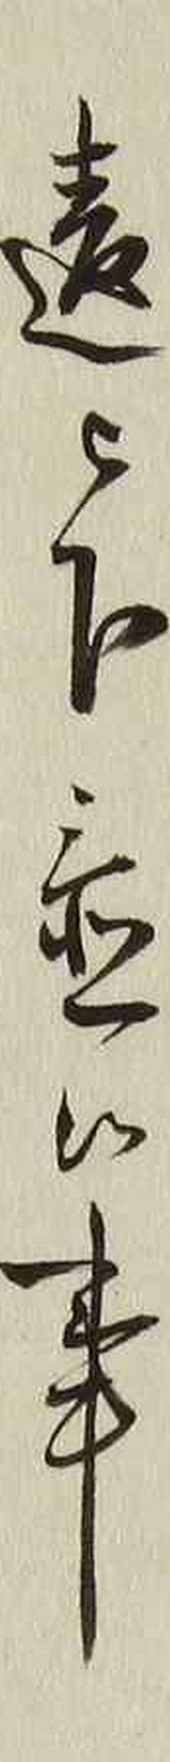違被下置候事
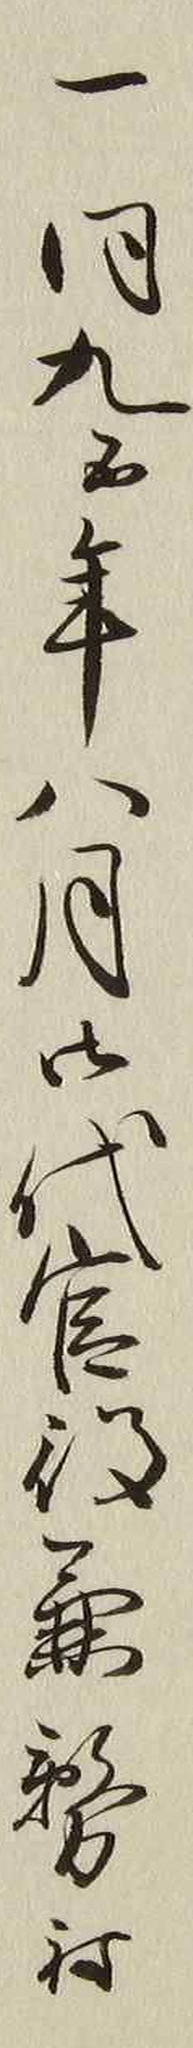一同九酉年八月御代官役兼務被
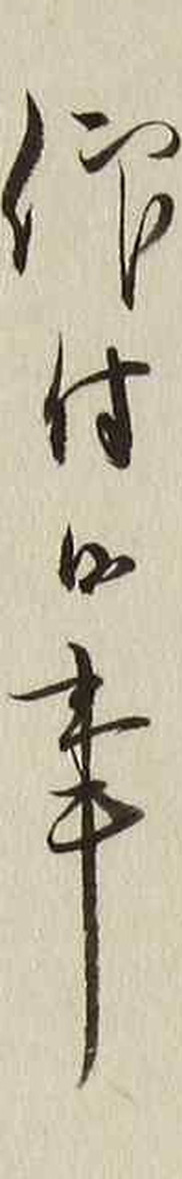仰付候事
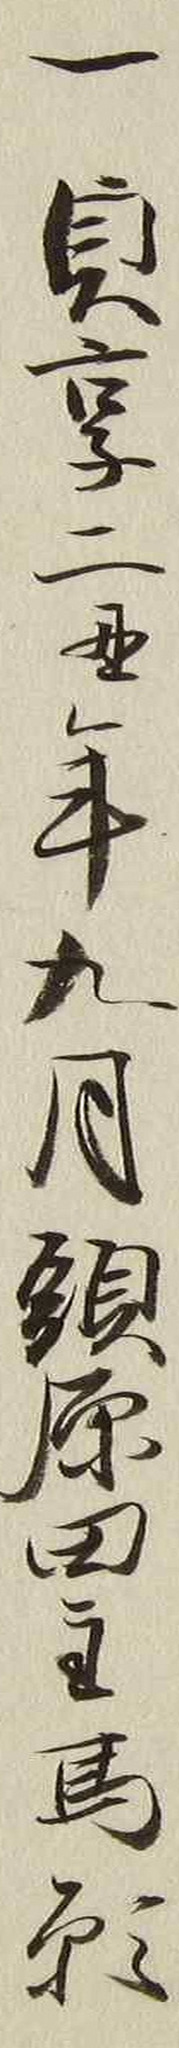一貞享二丑年九月頭原田主馬願
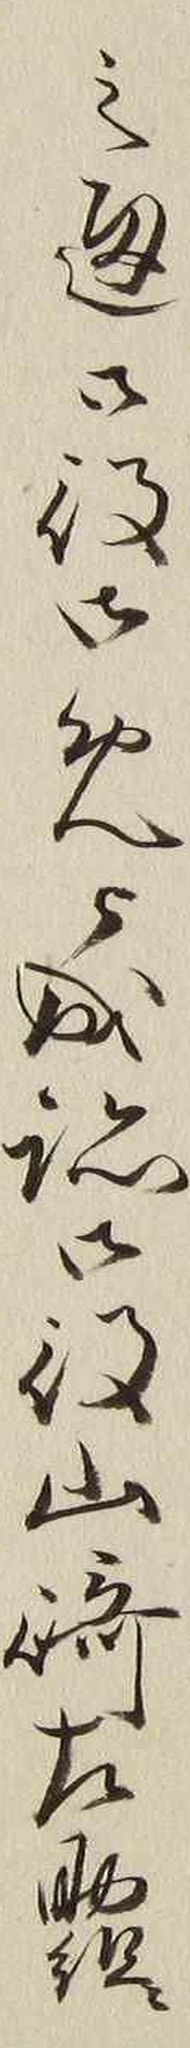之通御役御免被成跡御役山崎左助組ニ
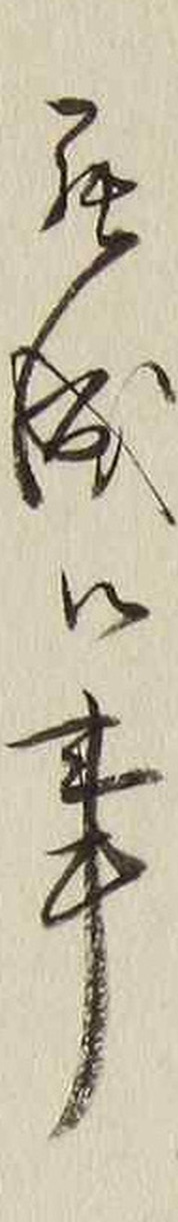罷成候事
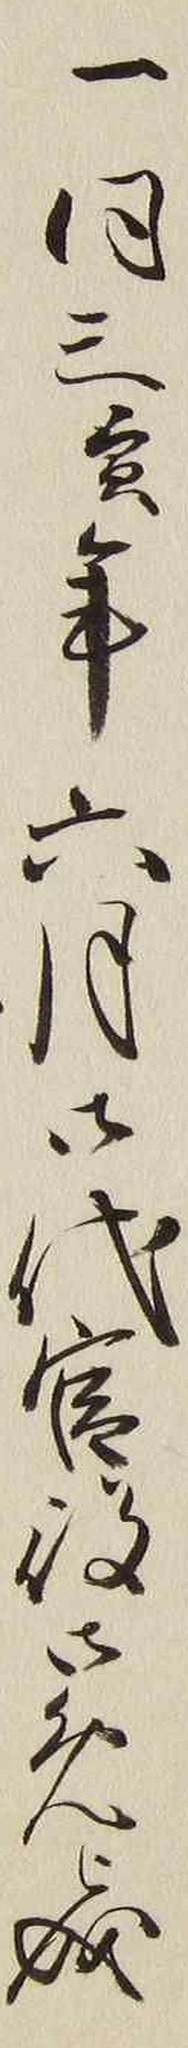一同三寅年六月御代官役御免被成
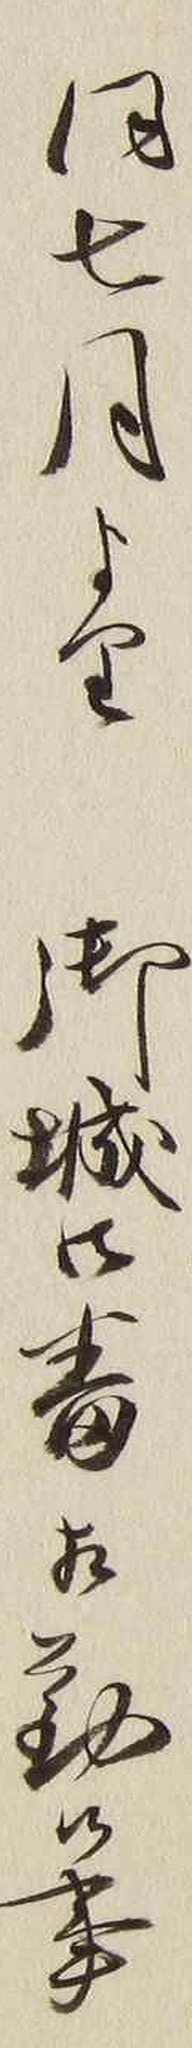同七月より御城御番相勤候事
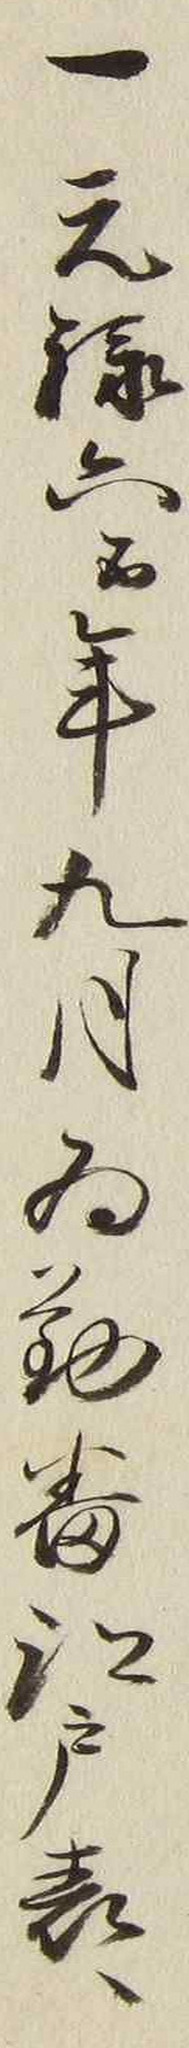一元禄六酉年九月為勤番江戸表ㇸ

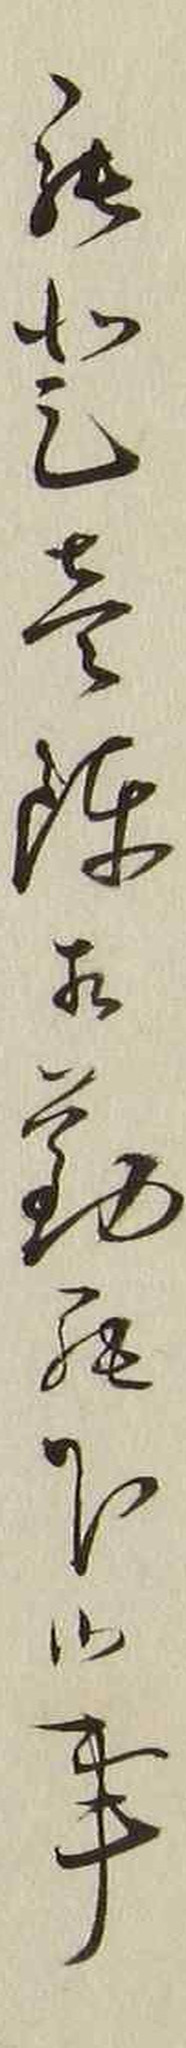罷登壱陣相勤罷下候事
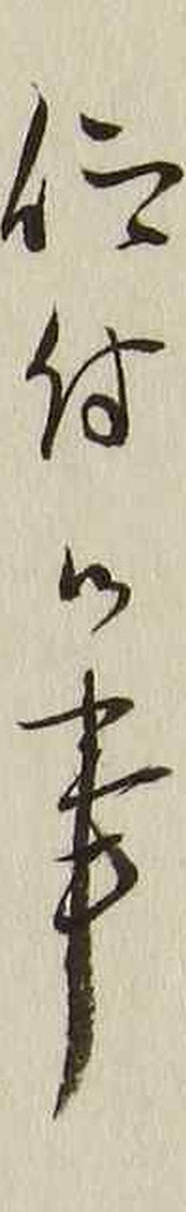仰付候事
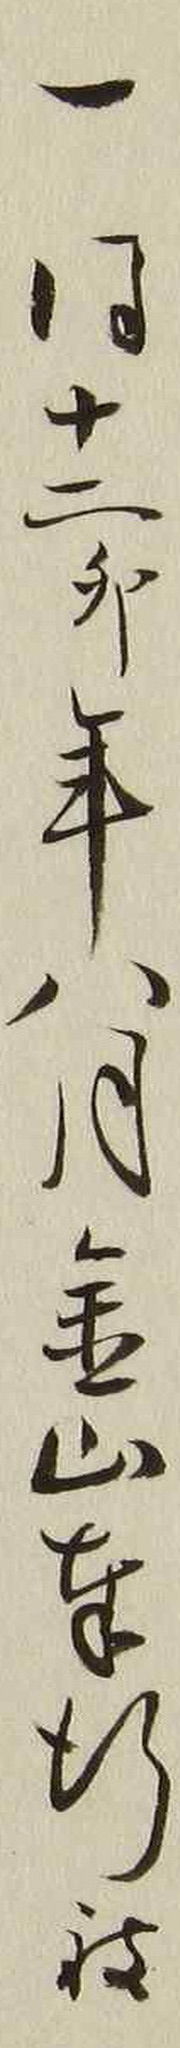一同十二卯年八月金山奉行被
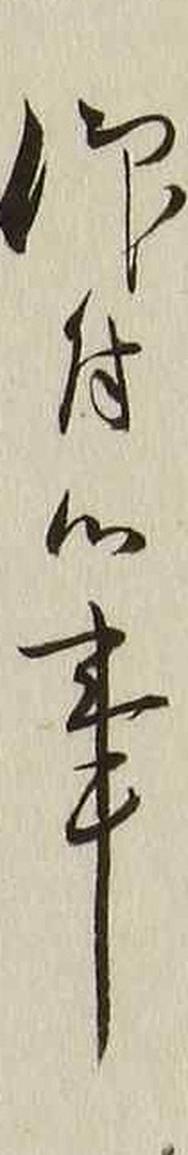仰付候事
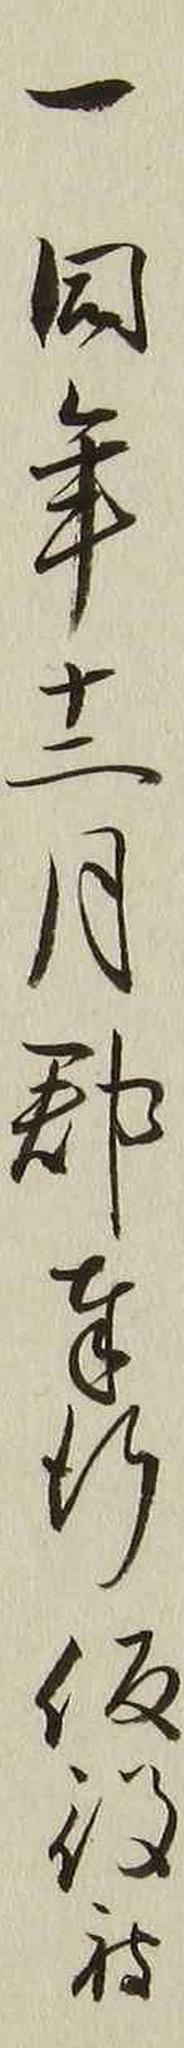一同年十二月郡奉行仮役被
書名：諸士系譜　巻之163　な之部5
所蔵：会津若松市立会津図書館
